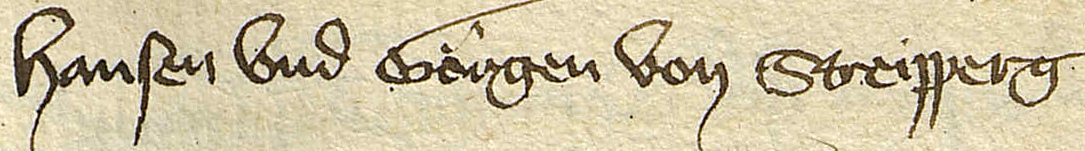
hanſen vnd Görgen von Streipperg
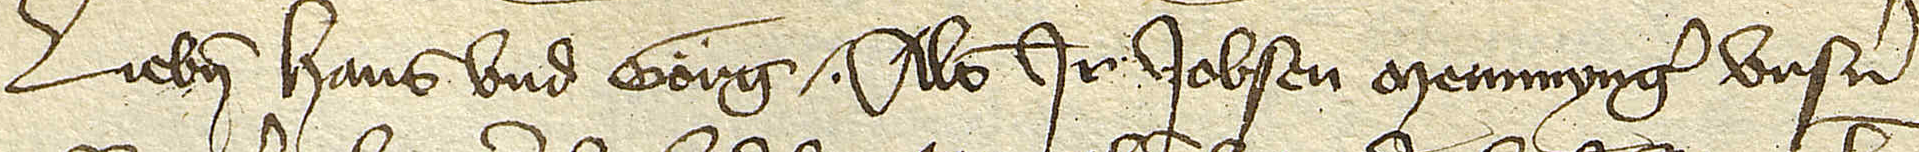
Liebn* hans vnd Görg / . Als Ir Iobſen Memmyng* vnſn*
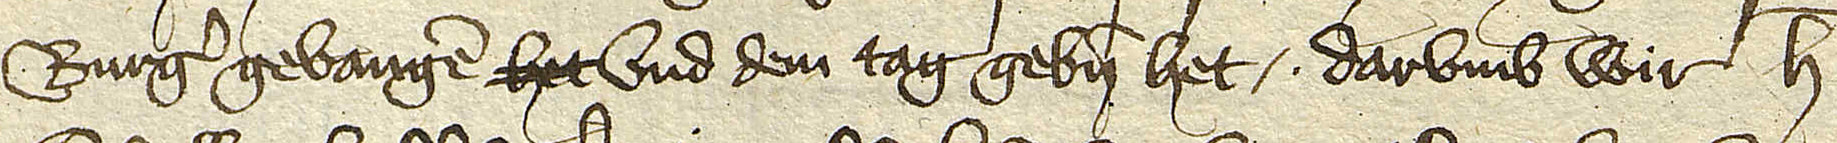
Burg* gevange* het vnd dem tag gebn* het / . darvmb wir h*
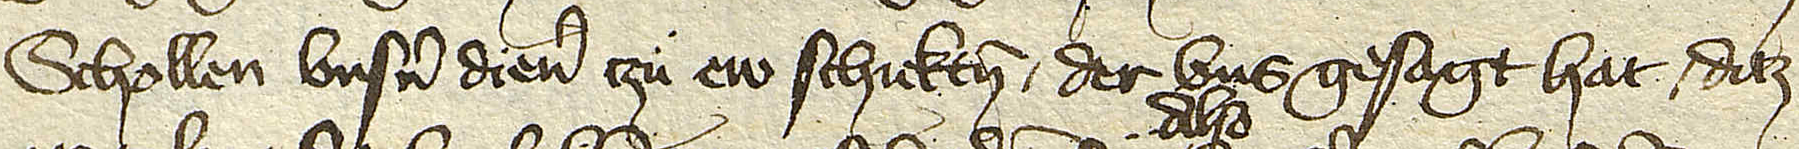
Schollen vnſn* dien* cʒü ew ſchicktn* / der vns geſagt hat / daʒ
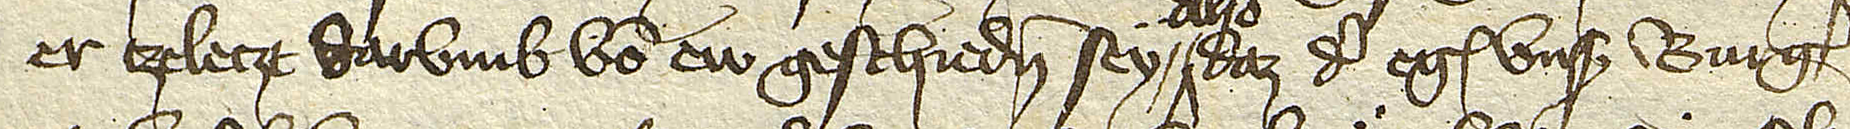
er cʒelecʒt darvmb vo* ew geſchiedn* ſey / daʒ d* eg* vnſ* Burg*
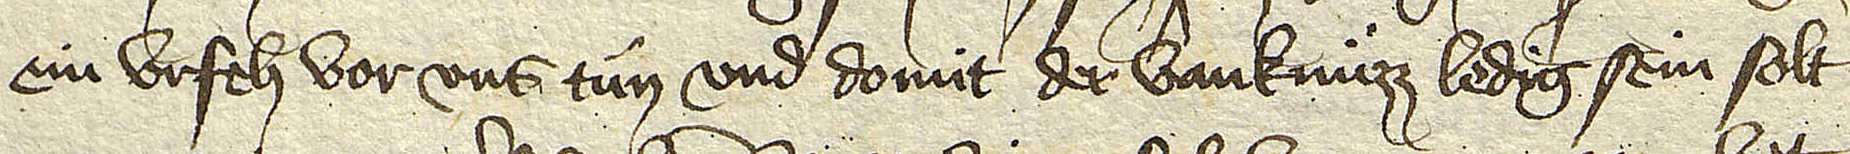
ein vrfeh vor vns tun vnd domit der vanknüʒʒ ledig ſein ſolt
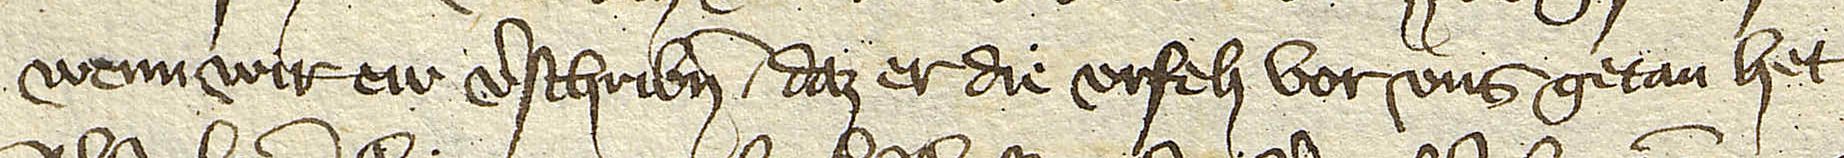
wenn wir ew v*ſchribn* / daʒ er die vrfeh vor vns getan het
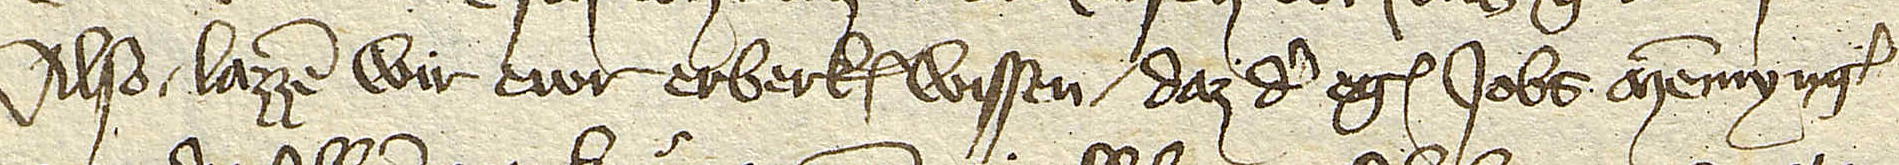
Alſo / laʒʒe* wir ewr erberk* wiſſen / daʒ d* eg* Iobs Mem*yng*
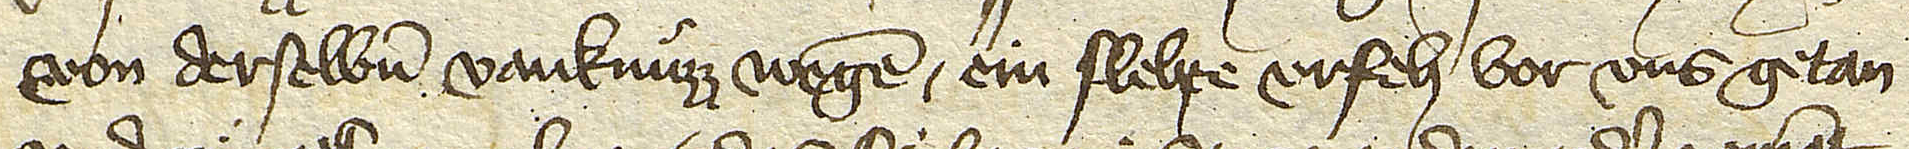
ewn derſelbn* vanküʒʒ wege* / ein ſlehte vrfeh vor vns getan
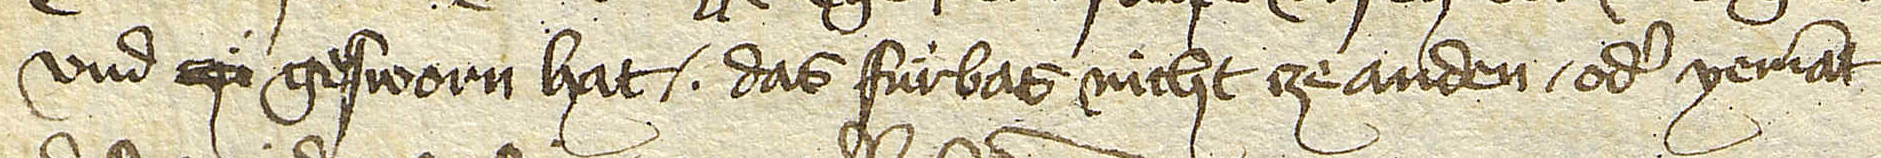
vnd cʒü geſworn hat / . das fürbas nicht cʒe anden / od* yemat*
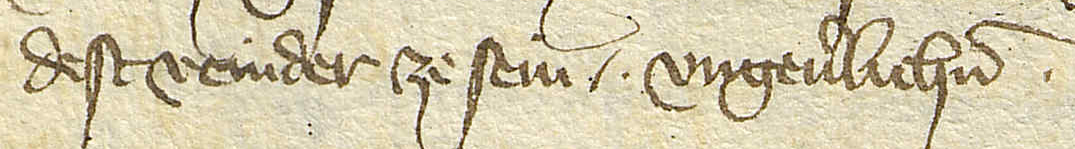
deſt veinder cʒe ſein / . vngeu*lichn* .
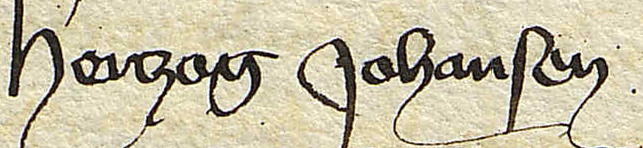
hercʒog Iohanſen
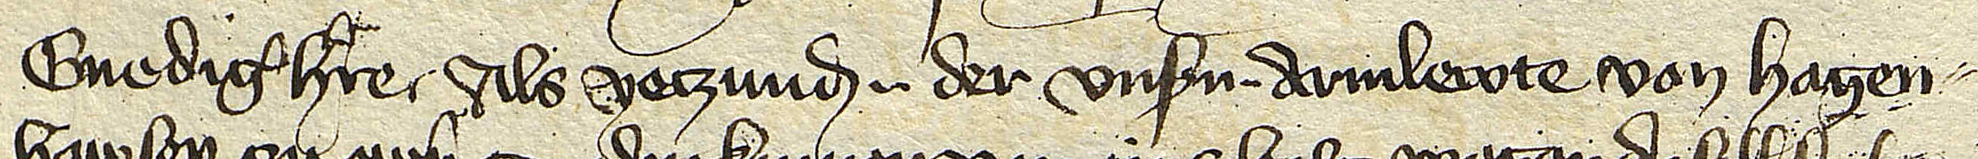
Gnedig* h*re / Als yecʒund* ~ der vnſ*n ~ Armlewte von hagen =
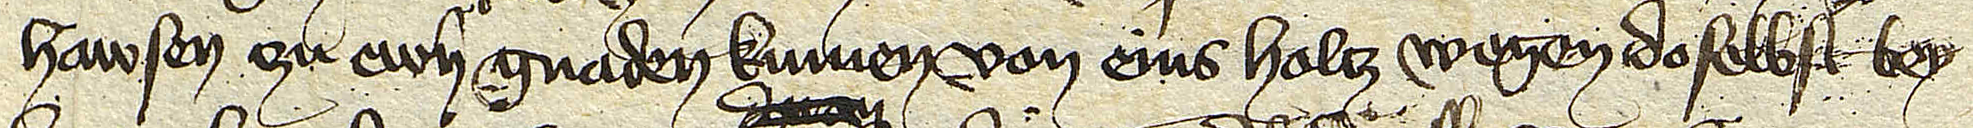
hawſen cʒu ewn* gnaden kumen von eins holcʒ wegen doſelbſt bey
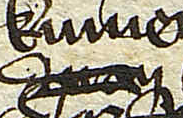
daran
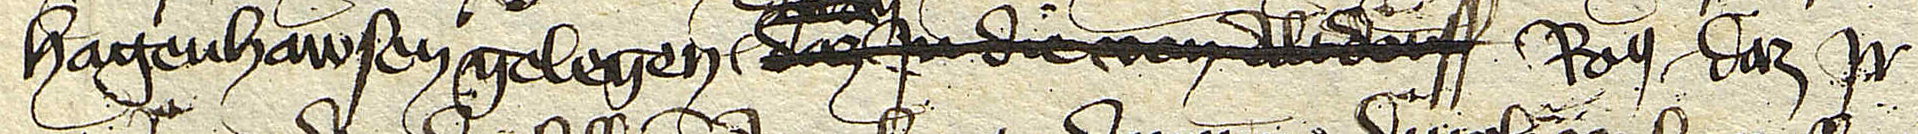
hagenhawſen gelegen / daʒ In die von Altdorff Ro* / daʒ Ir
